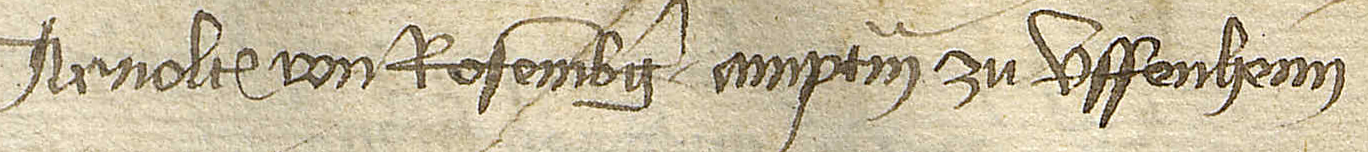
Arnolt* von Roſemb*g / amptm* ʒu Vffenheim
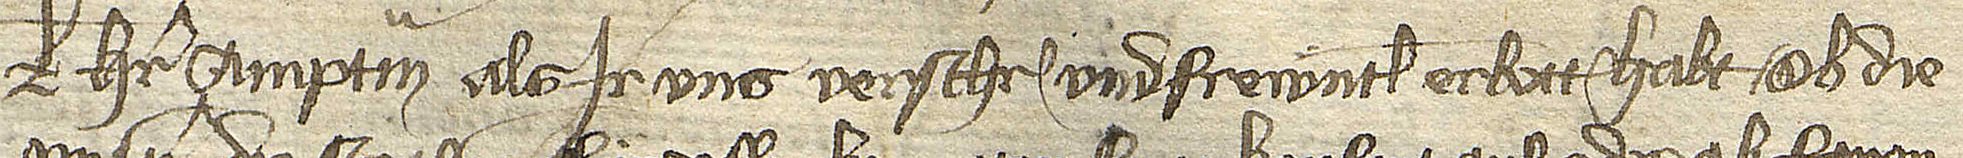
L* hr* Amptm* als Ir vns verſchr* vnd freẅntl* erbott* habt / Ob die
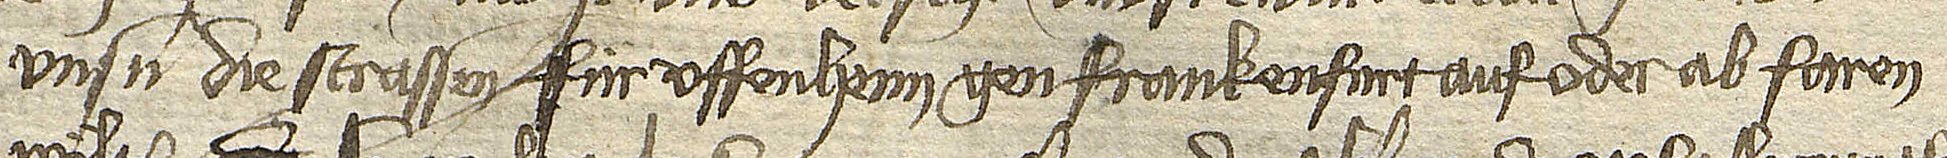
vnſn* die ſtraſſen für vffenheim gen frankenfurt auf oder ab faren
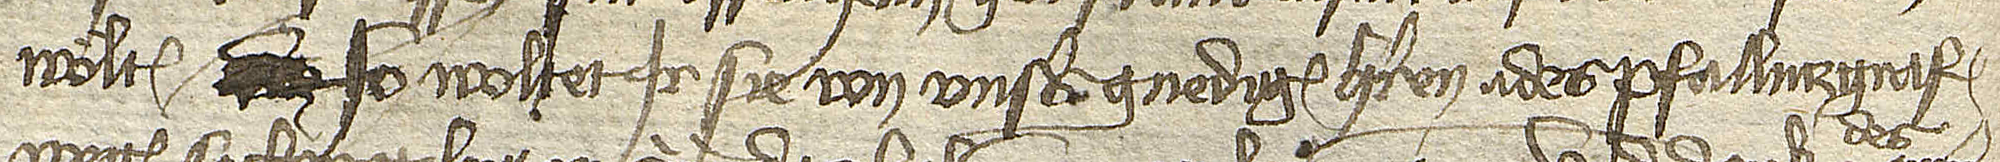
wölt* / Daʒ ſo woltet Ir ſie von vnſ*s gnedig* h*ren ~ des Pfallncʒgraf*
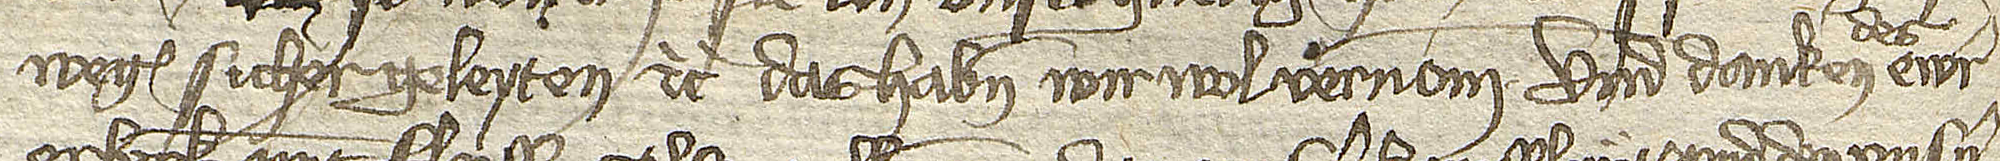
weg* ſicher geleyten ec* das habn* wir wol vernom* . Vnd danken eẅr*
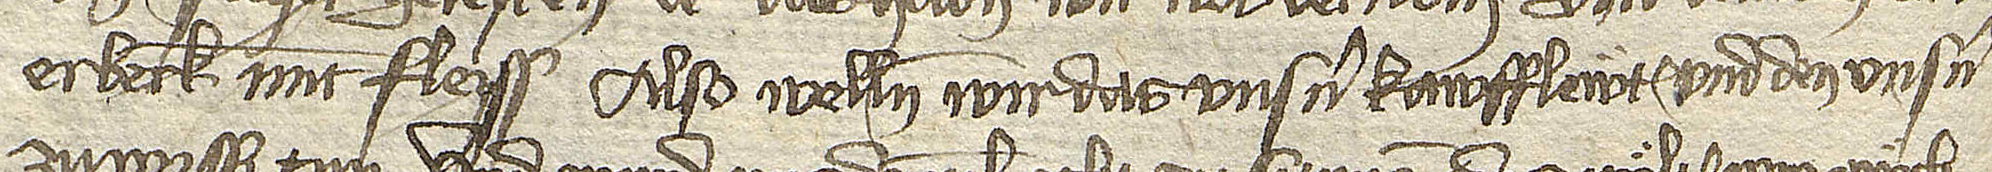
erberk* mit fleiſſ Alſo welln* wir das vnſn* lawffleẅt* vnd den vnſn*
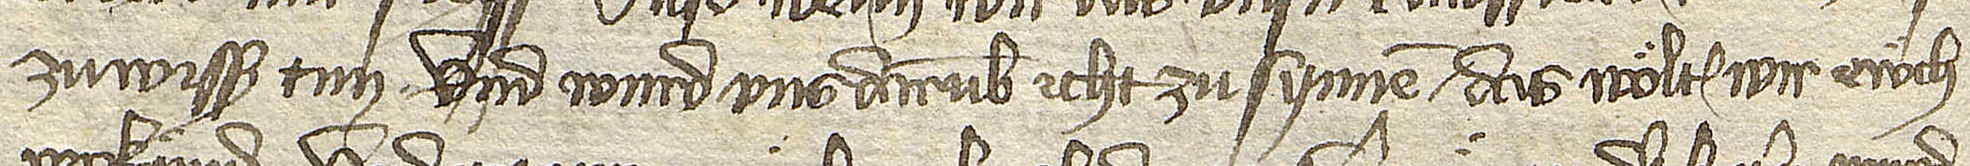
ʒuwiſſ* tun . Vnd wurd vns darub* icht ʒu ſynne* / das wölt* wir eẅch
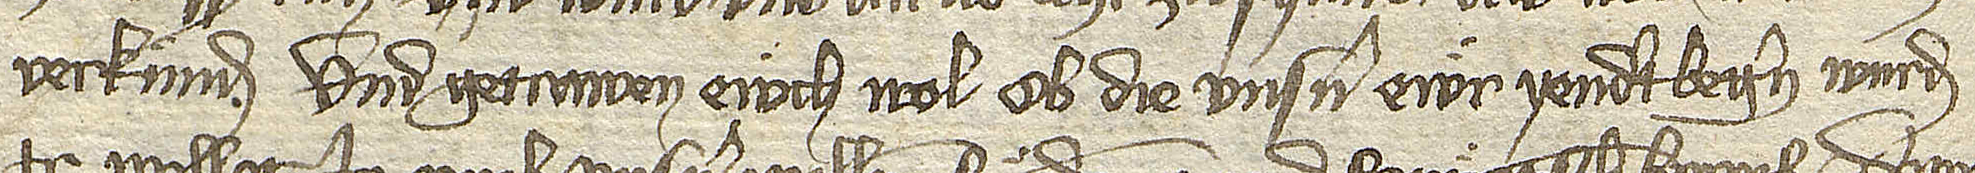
verkünd* Vnd getrawen eẅch wol Ob die vnſn* eẅr yend*t beg*n wurd*
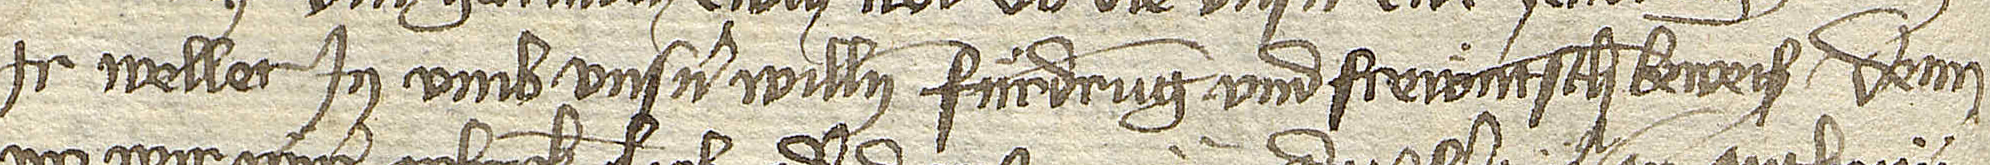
Ir wellet In vmb vnſn* willn* fürdru*g vnd freẅntſch* beweiſ* / Denn
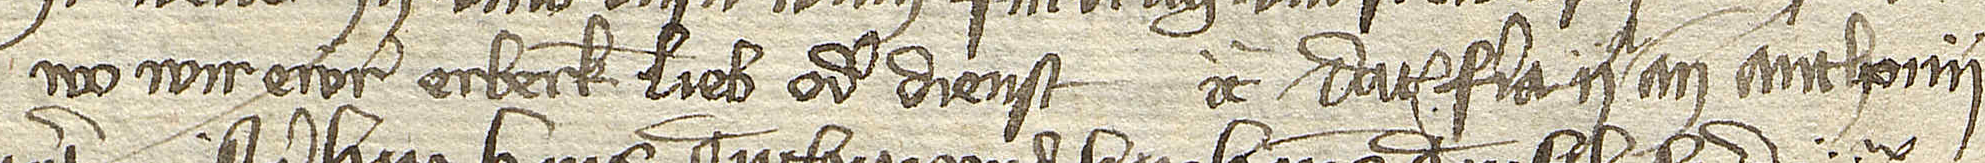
wo wir eẅr* erberk* lieb od* dienſt ec* / Dat* fi*a ii* an* anthonii
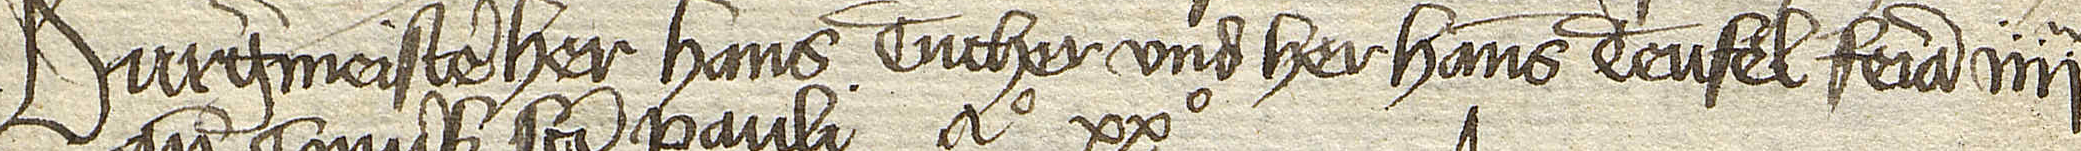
Burg*meiſte* her hans Tucher vnd her han*s Teufel fei*a iiii*
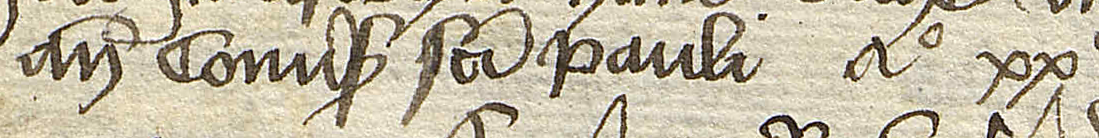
an* Conu*ſ* ſci* Pauli a* xx*
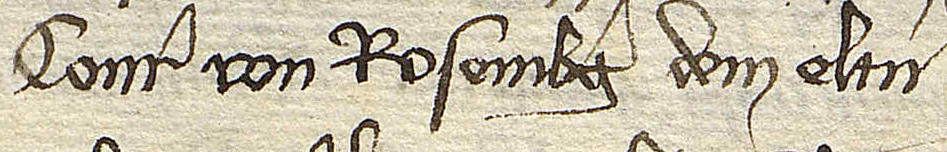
Conr* von Roſemb*g dem eltn*
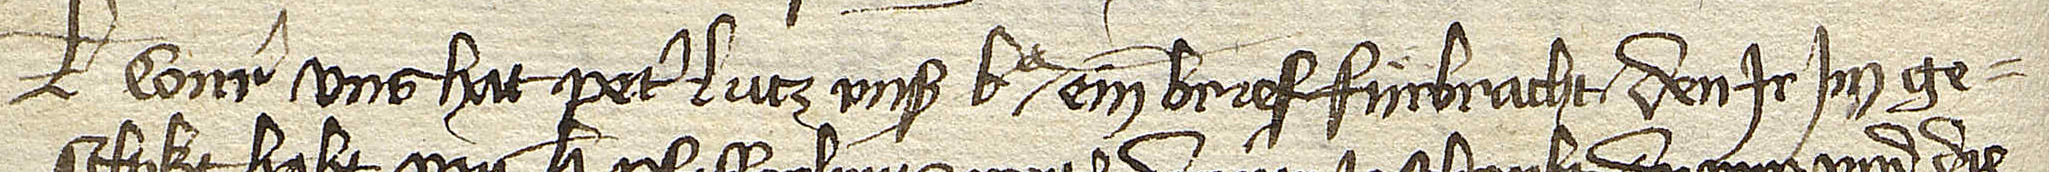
L* Conr* vns hat pet* lucʒ vnſ* b* / ein brief fürbracht / Den Ir Im ge =
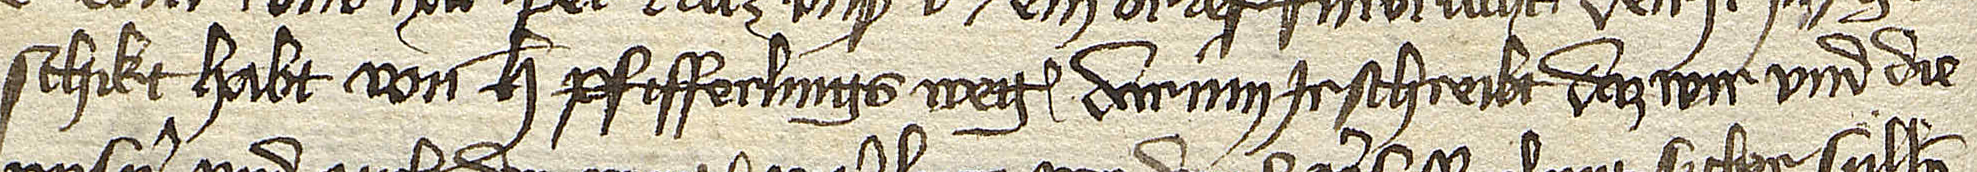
ſchikt habt von h* pfifferlings weg* Darinn Ir ſchreibt Daʒ wir vnd die
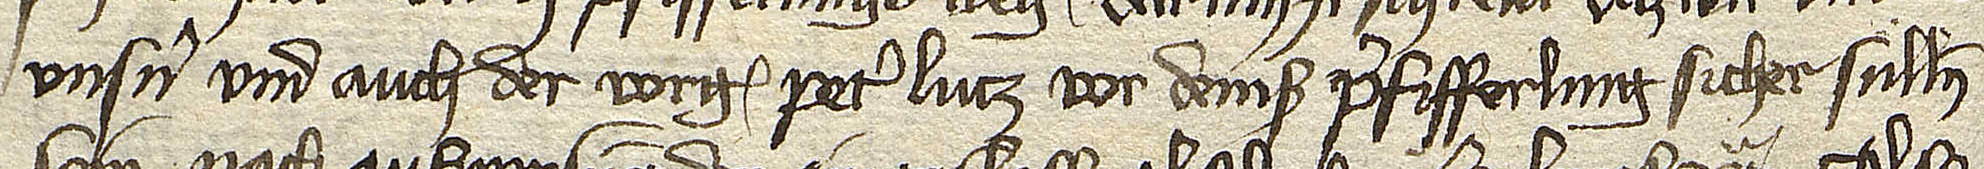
vnſn* vnd auch der vorg* pet* lucʒ vor demſ* Pfifferling ſicher ſülln*
